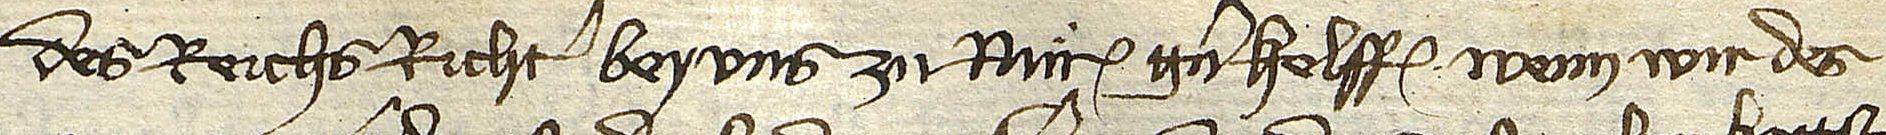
des Reichs Richt* bey vns ʒu Nür* g*n helff* . wenn wir des
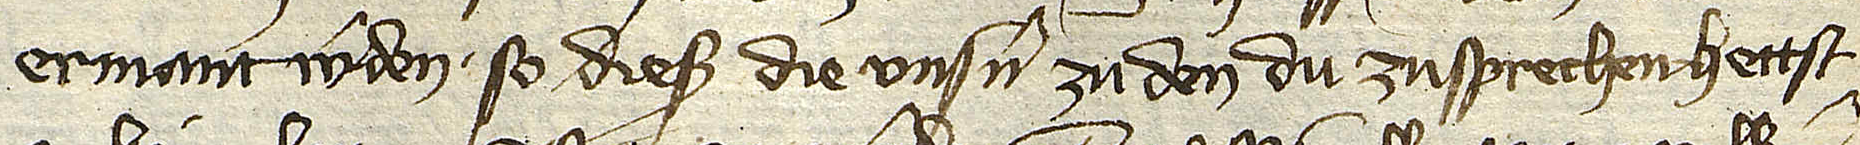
ermant w*den . ſo dieſ* vnſ*n ʒu den du ʒuſprechen hettſt
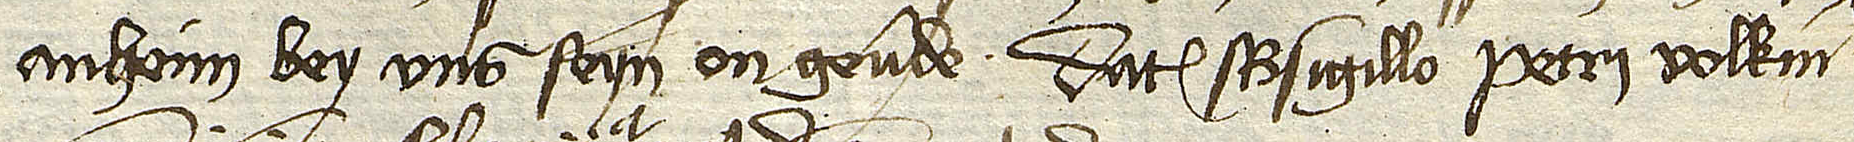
anheim bey vns ſeyn on geu*de . Dat* ſ*B ſigillo Petri volkm*
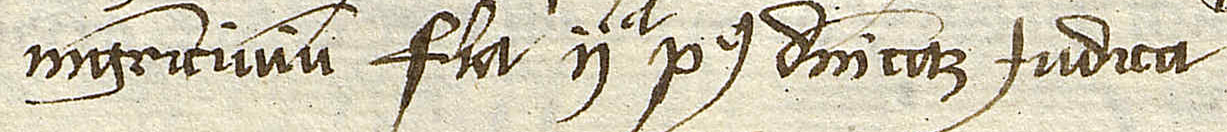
m*g*r*iciuiu* fia* ii* p* dnica* Iudica
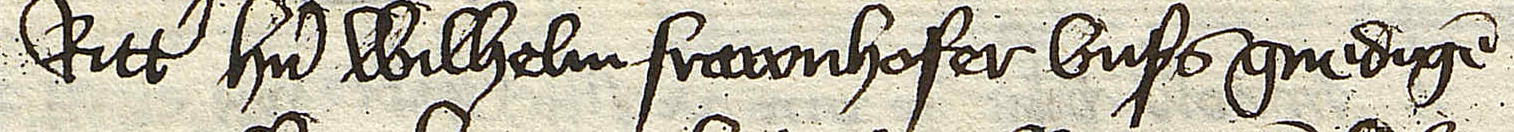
Ritt* h*n Wilhelm frawnhofer vnſ*s gnedige*
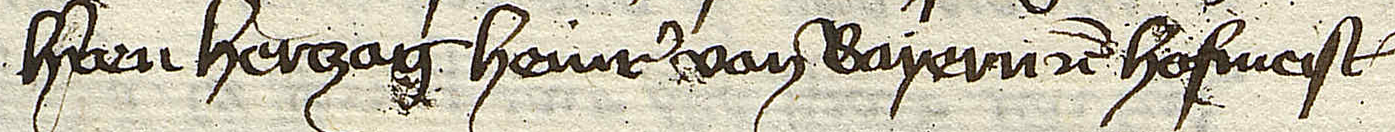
h*ren Hercʒog heinr* von Bayern ec* hofmeiſt*
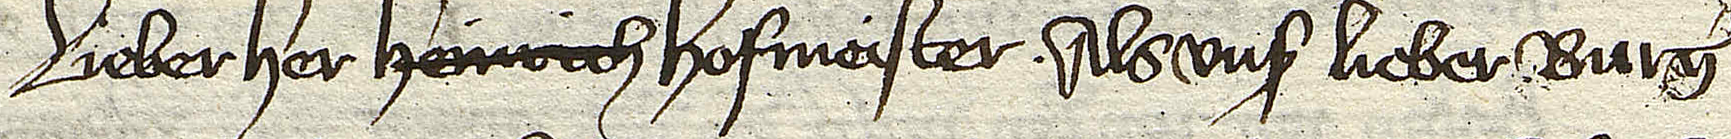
Lieber her heinrich hofmeiſter . Als vnſ* lieber Burg*
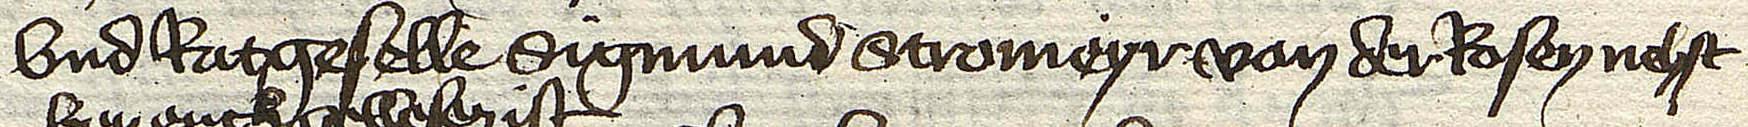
vnd Ratgeſelle Sigmund Stromeyr von der Roſen nehſt
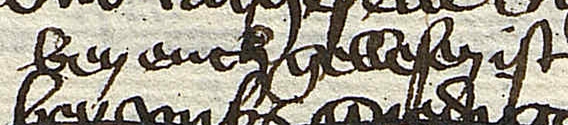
bey euch geweſen iſt
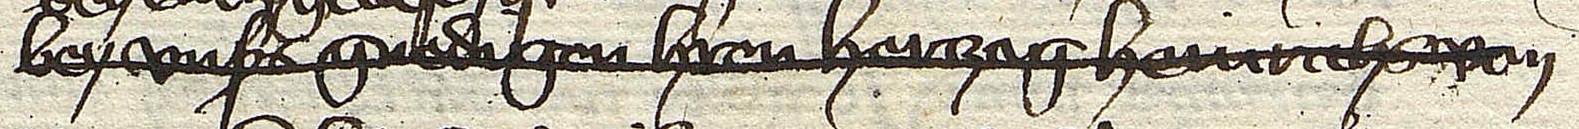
bey vnſ*s gnedigen h*ren hercʒog heinrichs von
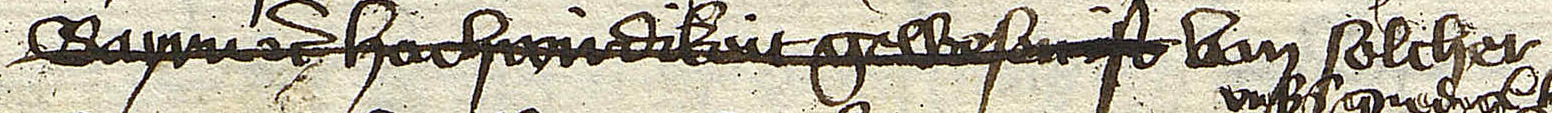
Bayrn ec* hochwirdikeit geweſen iſt von ſolcher
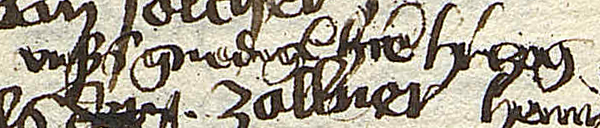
vnſ*s gnedige* h*re h*rcʒog
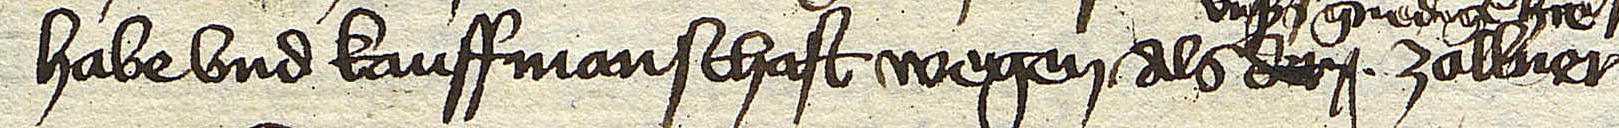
habe vnd kauffmanſchaft wegen / Als der ʒollner
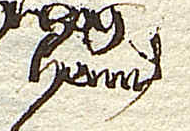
heinr*
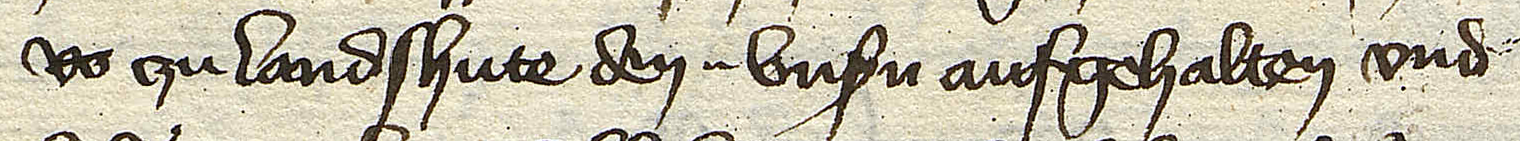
vo cʒu landſhute den ~ vnſ*n aufgehalten vnd
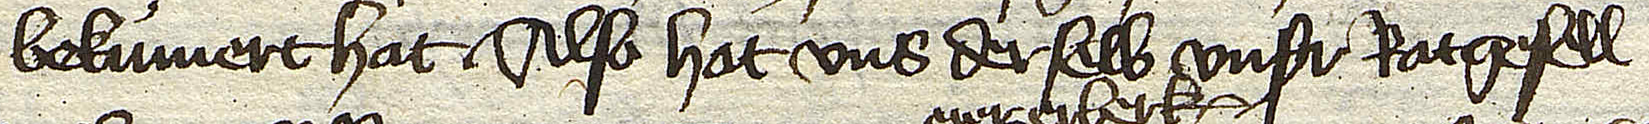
bekümert hat / Alſo hat vns derſelb vnſ*r Ratgeſell
